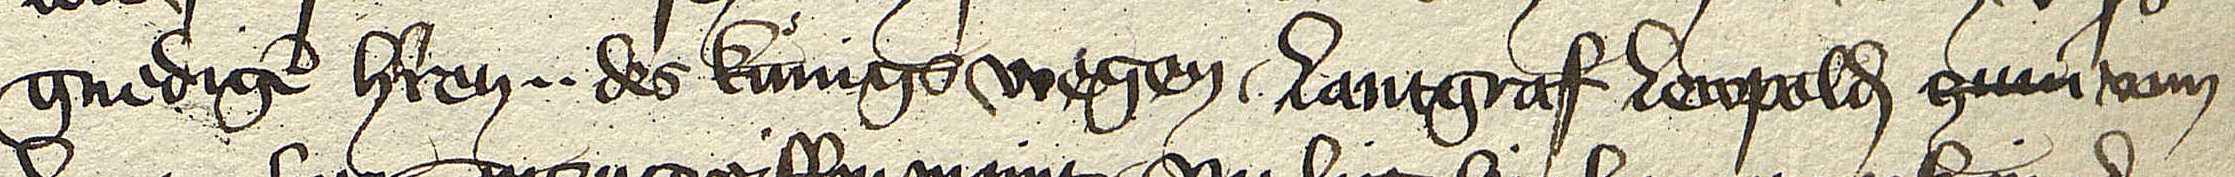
gnedige* hr*en ~ des künigs wegen / lantgraf lewpold* cʒum vom
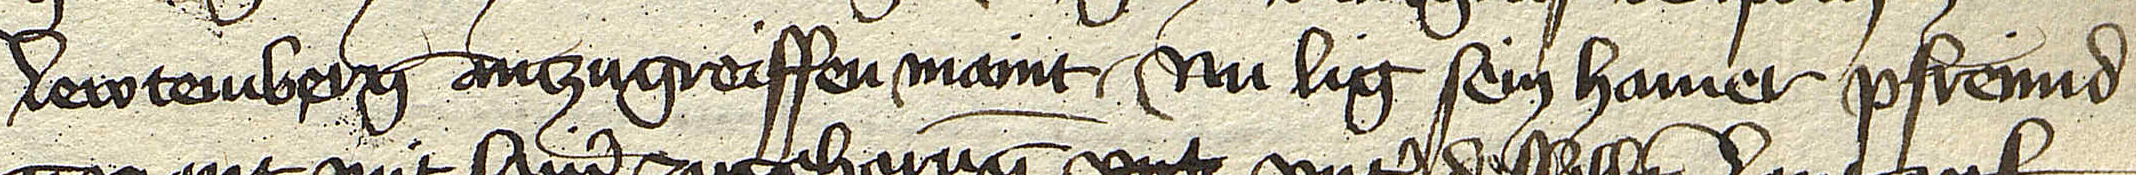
Lewtemberg ancʒugreiffen maint / Nu lig ſein hamer pfreimd
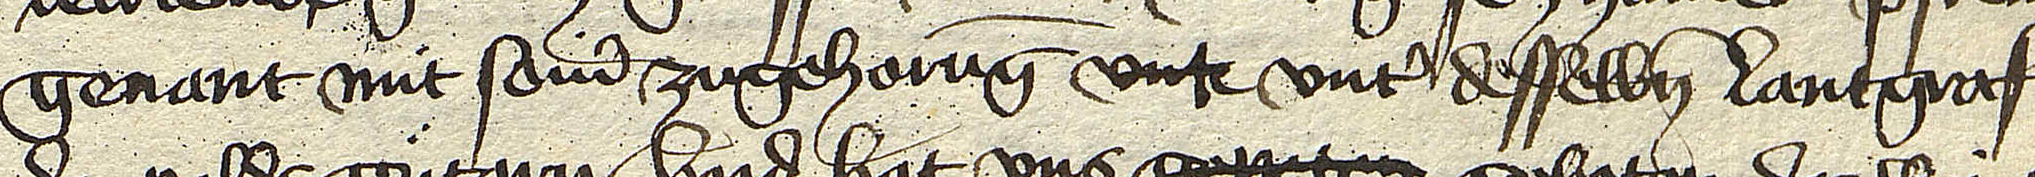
genant mit ſein* cʒugehorug* vnte vnt* deſſelbn* lantgraf
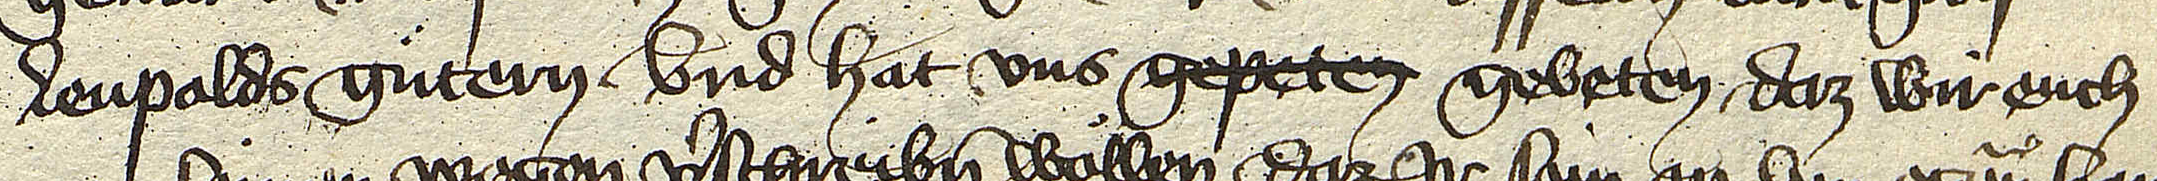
leupolds gütern / vnd hat vns gepeten gebeten / daʒ wir euch
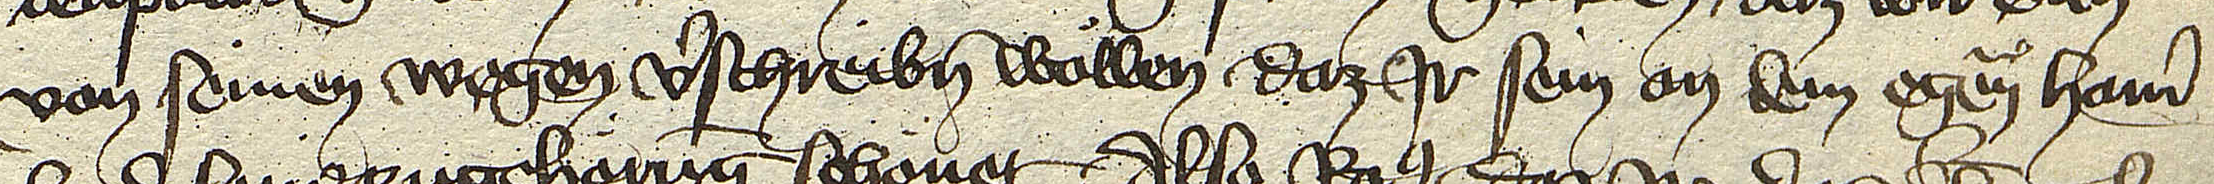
von ſeinen wegen v*ſchreibn* wöllen / daʒ Ir ſein an dem egen* ham*
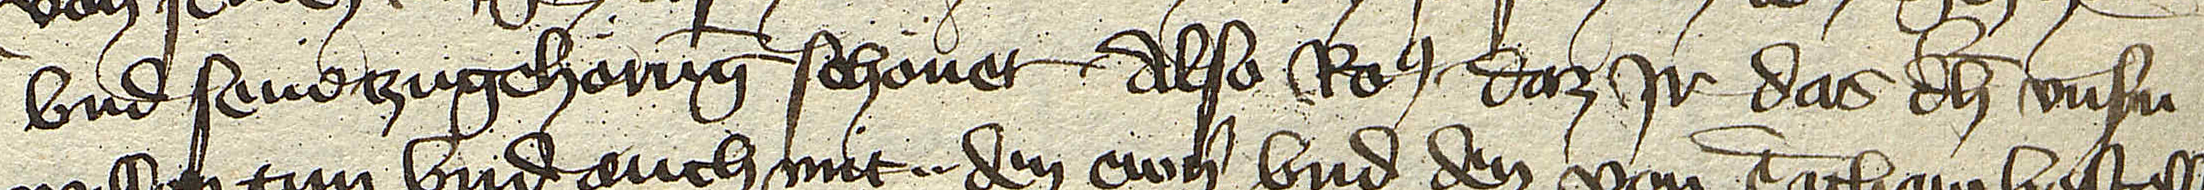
vnd ſein* cʒugehörug* ſchönet / Alſo Ro* / daʒ Ir das d*h vnſ*n
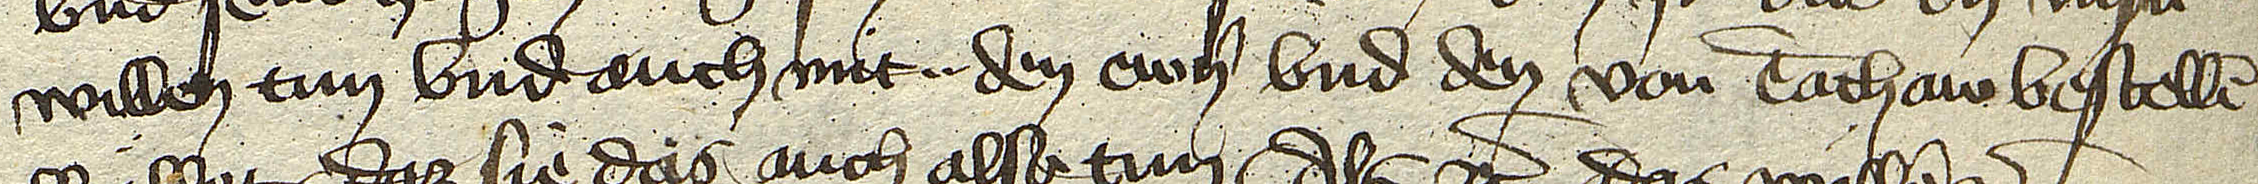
willen tun vnd auch mit ~ den ewn* vnd den von Tachaw beſtelle*
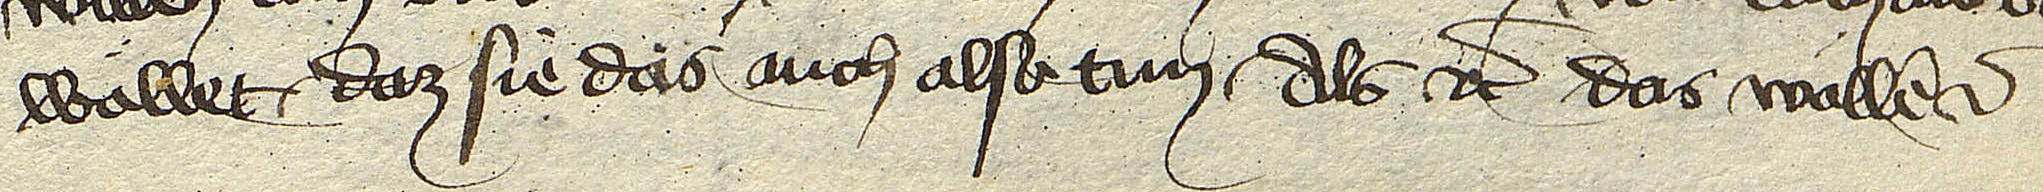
wöllet / daʒ ſie das auch alſo tun / Als ec* das wölle* ec*
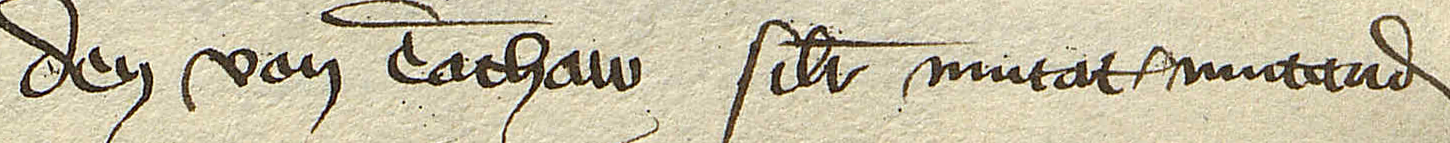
den von Tachaw ſilr* mutat* mutand*
